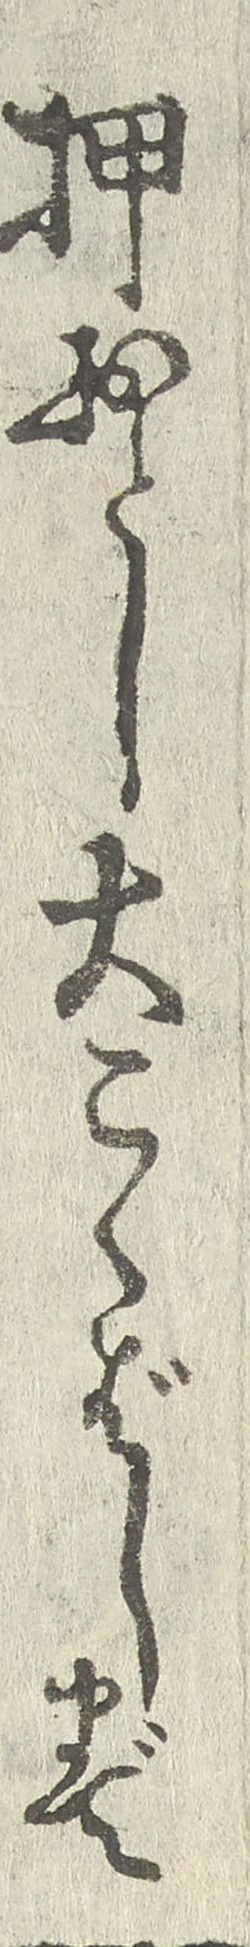押おとし大こくばしまで
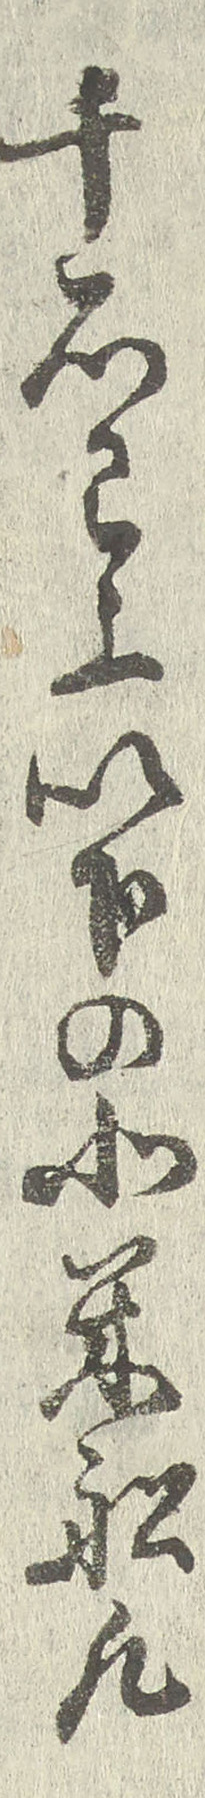千石已上以下の北米船凡
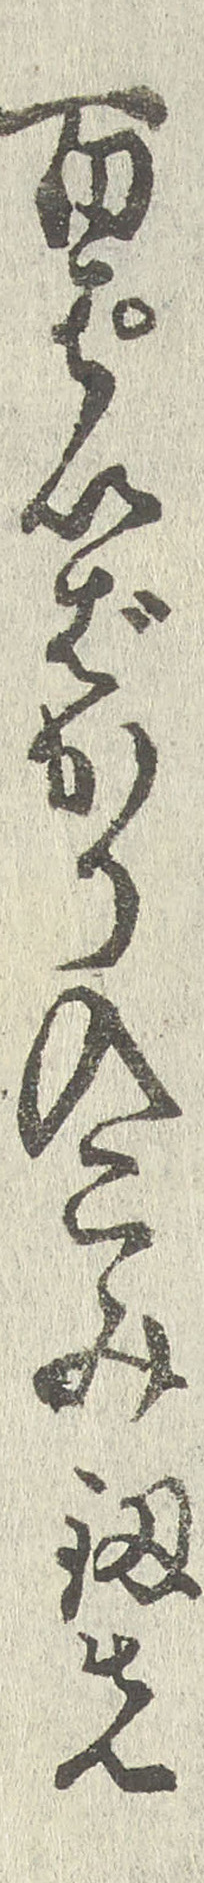百ぱいばかり入こみ釼先
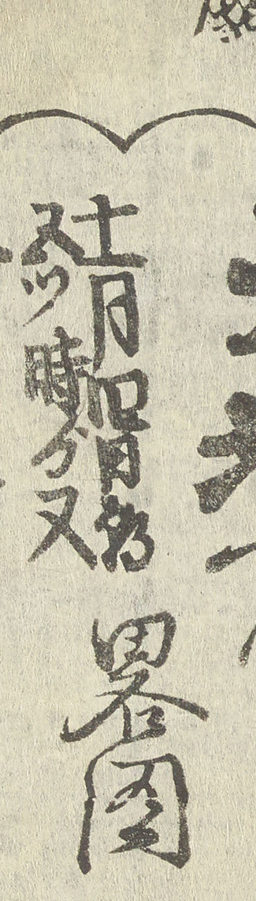十一月四日朝
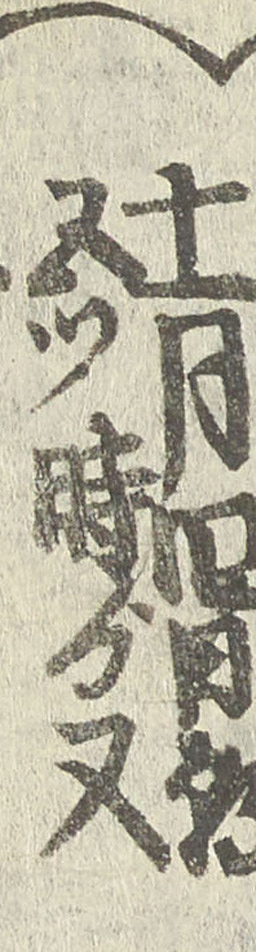五ツ時ゟ又
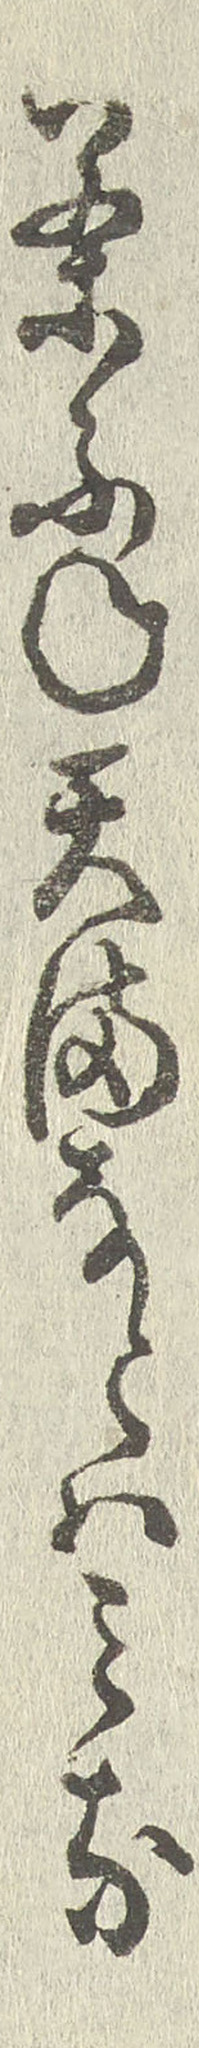茶ふね天満なとはみな
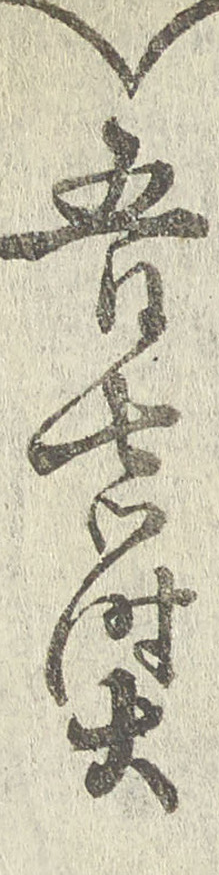五日七ツ時大
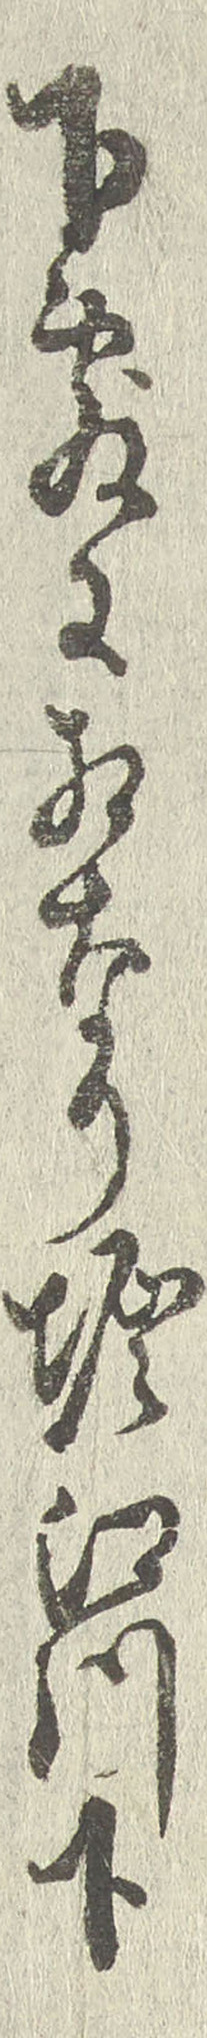下敷に相なり堀江川下
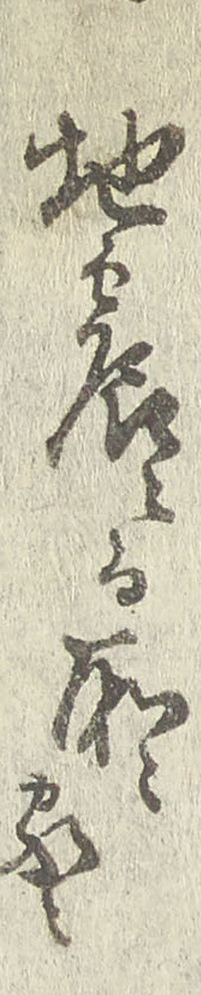地震にて所々家々
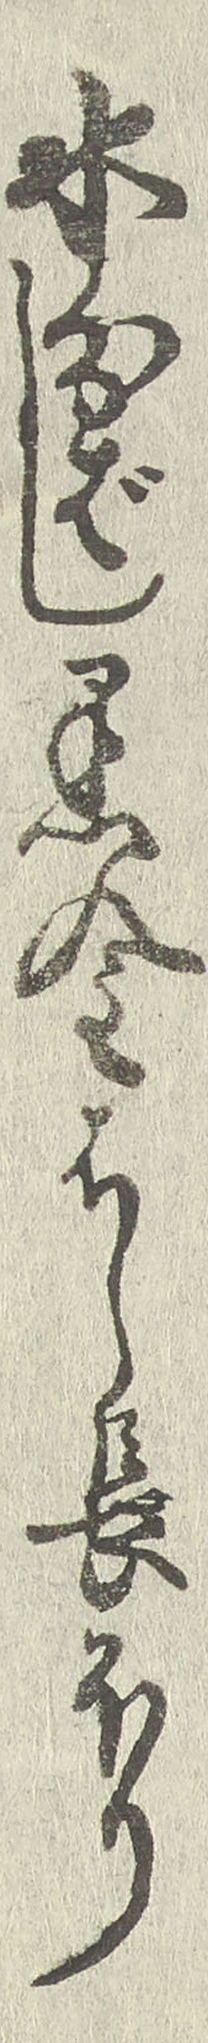水分ばし黒金はし長ほり
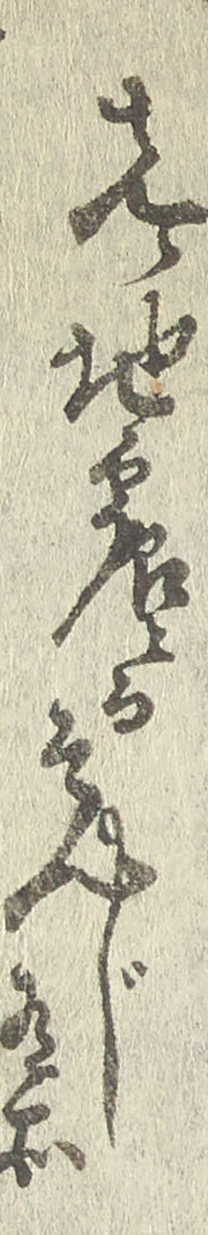先に地震にてそんじ有所
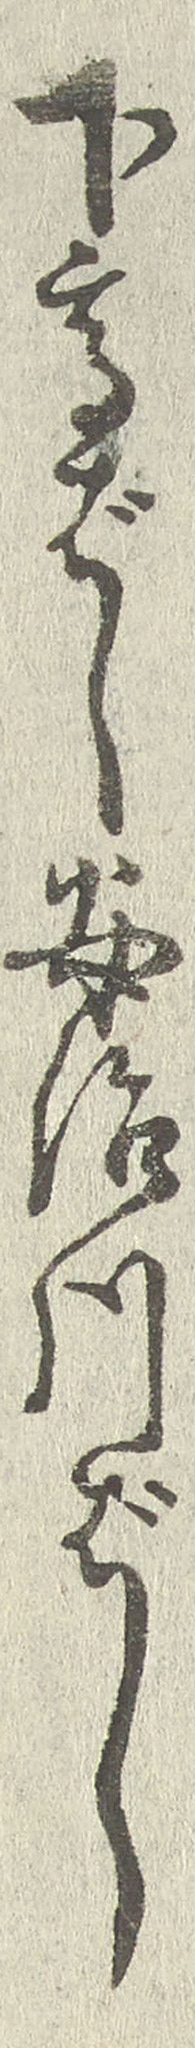下高ばし安治川ばし
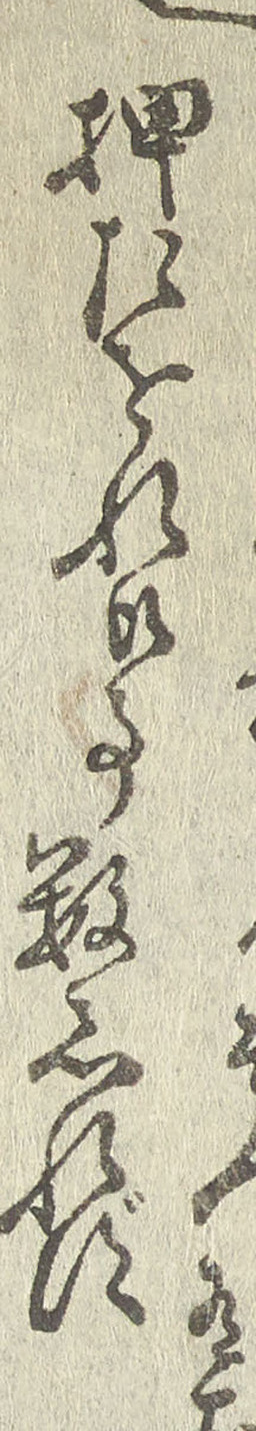押たをれ候事数しれず
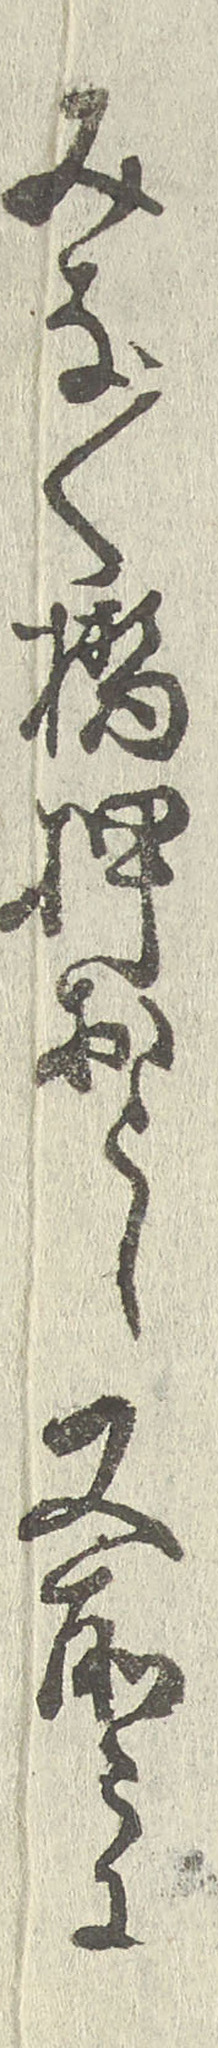みな〳〵橋押おとし又所々に
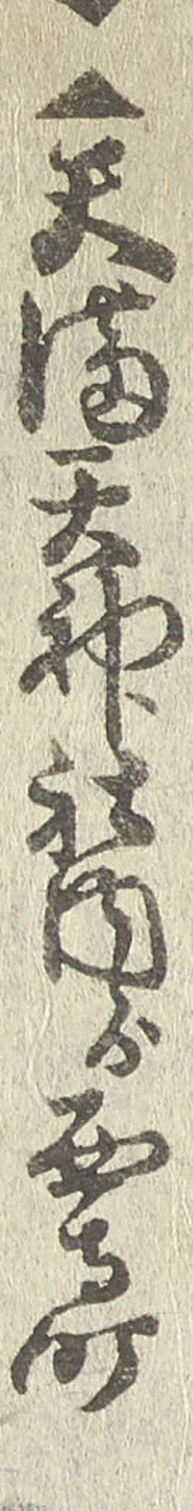▲天満天神社内ゟ西寺町
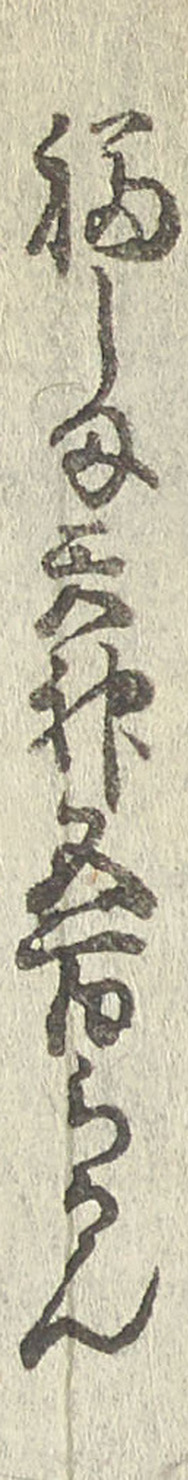福しま天神五百らかん
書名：摂津大津波次第
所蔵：東京大学総合図書館 General Library in the University of Tokyo, JAPAN
